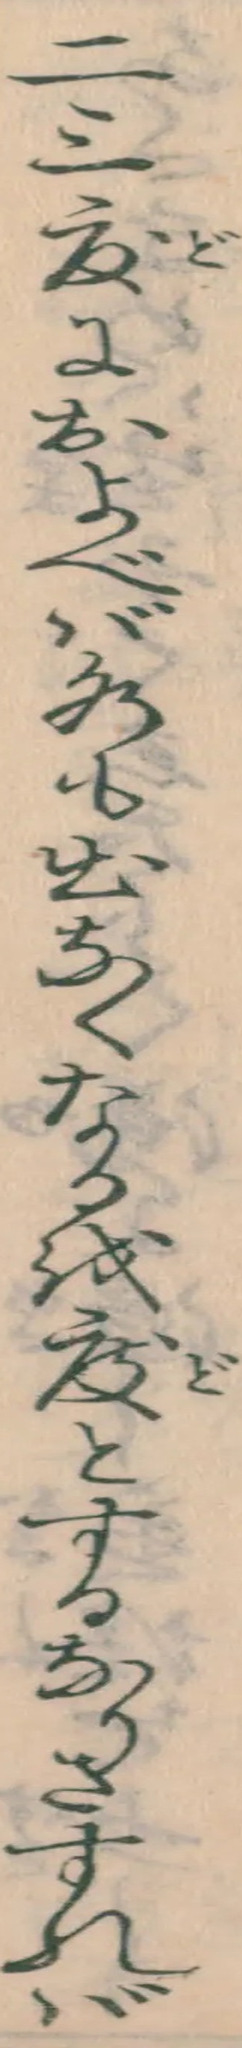二三度におよべば水も出なくなるを度とするなりさすれば
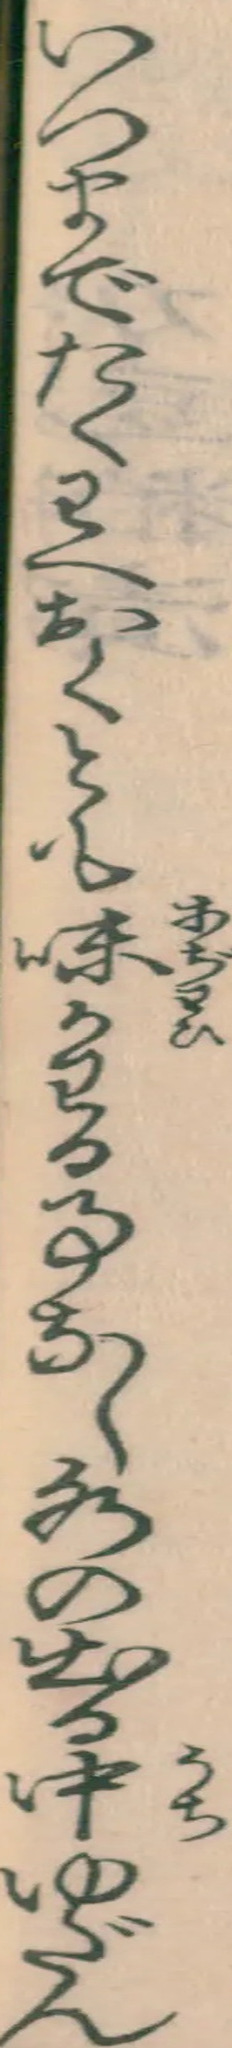いつまでたくわへおくとも味かわる事なし水の出る中ゆだん
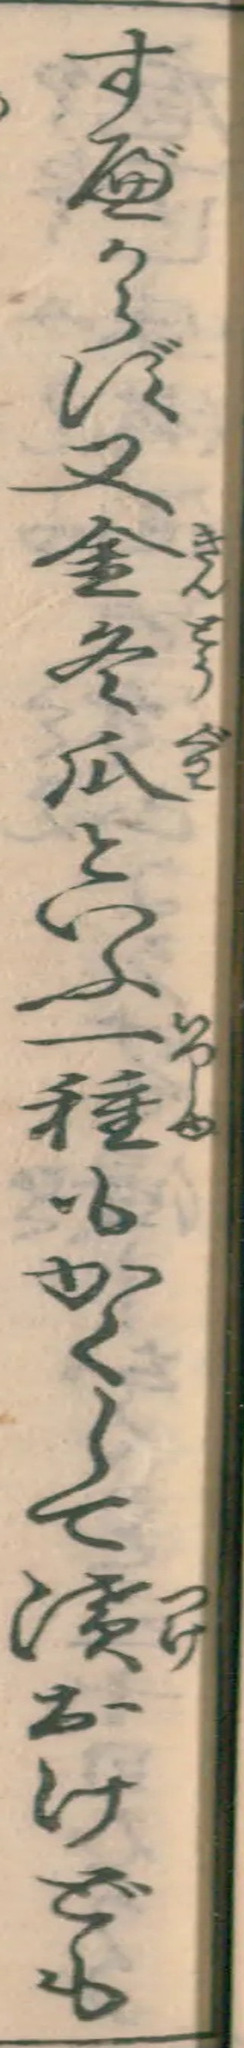すべからず又金冬瓜といふ一種もかくして漬おけども
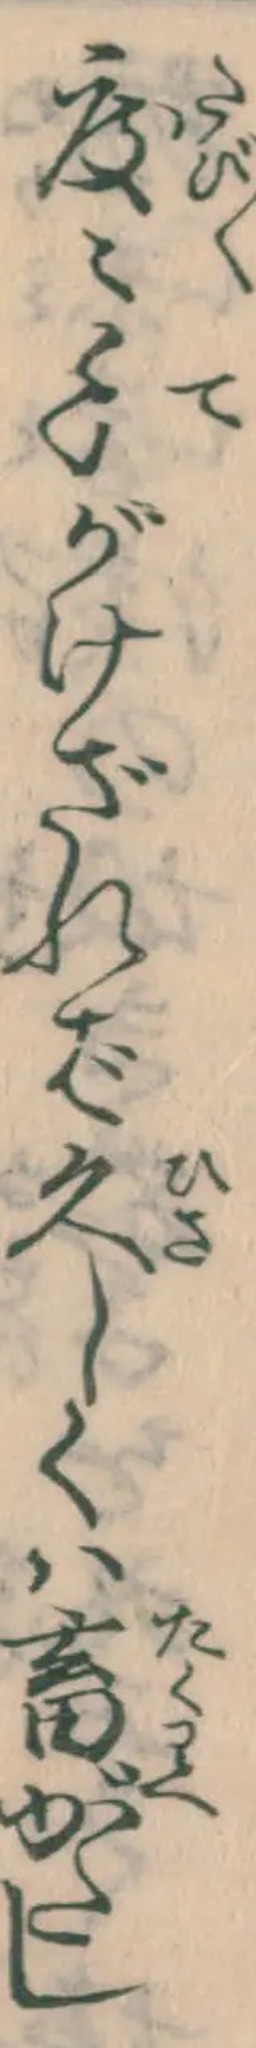度々手がけざれば久しくは畜がたし
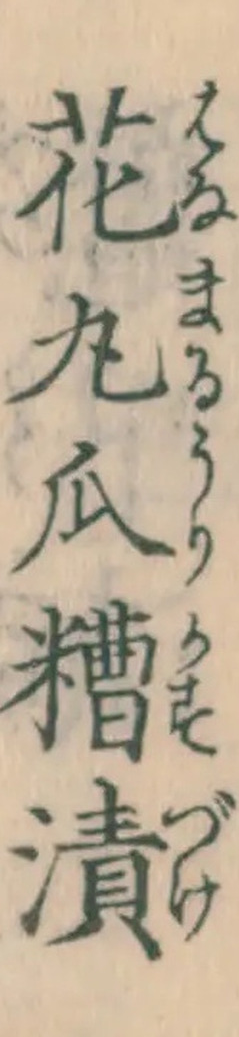花丸瓜糟漬
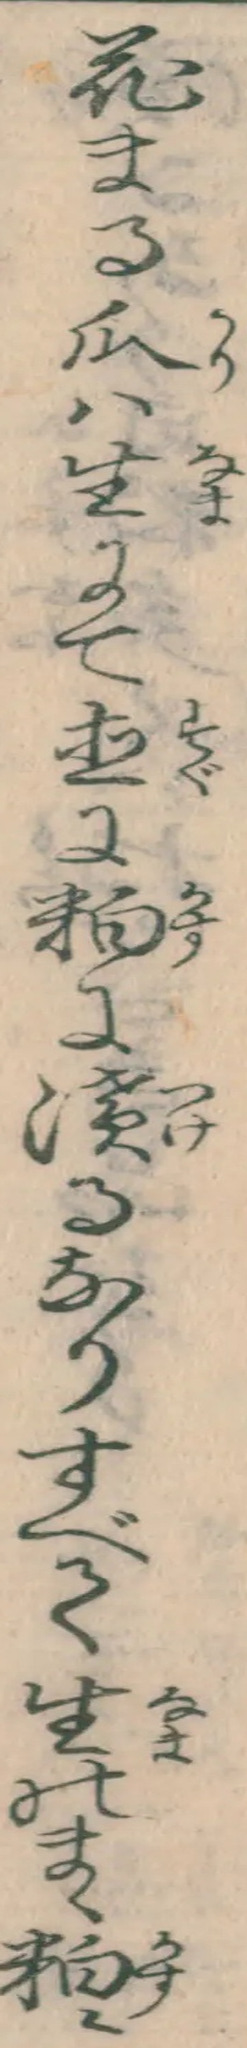花まる瓜は生にて直に粕に漬るなりすべて生のまゝ粕に
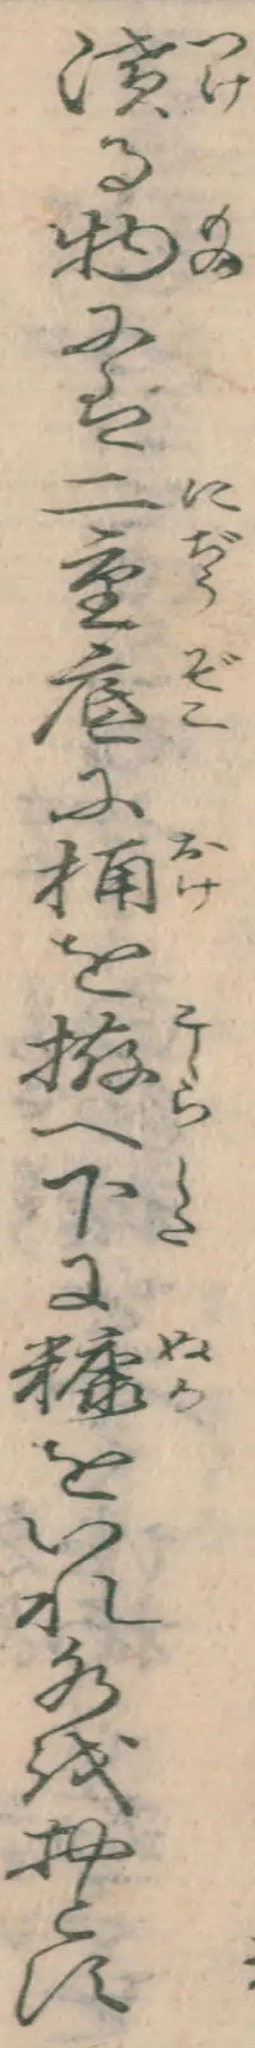漬る物には二重底に桶を拵へ下に糠をいれ水をおとす
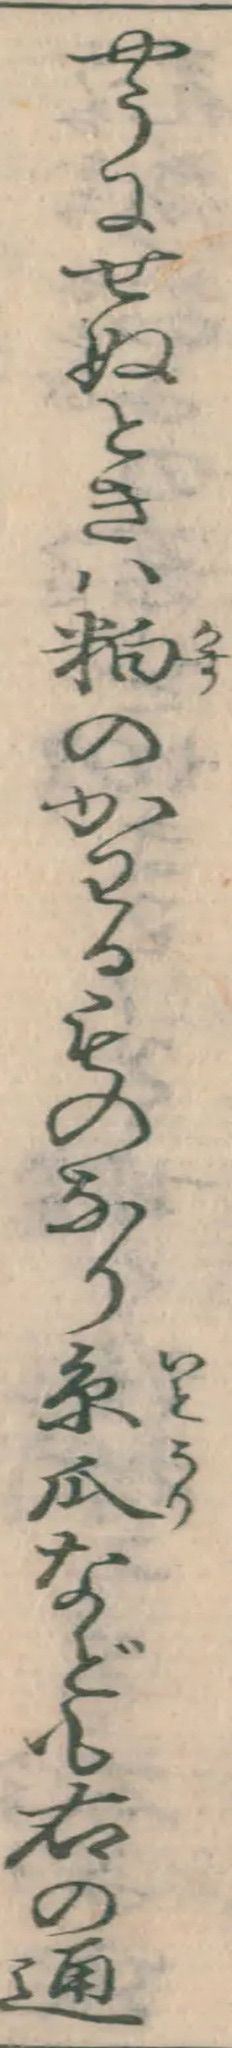やうにせぬときは粕のかわるものなり糸瓜なども右の通
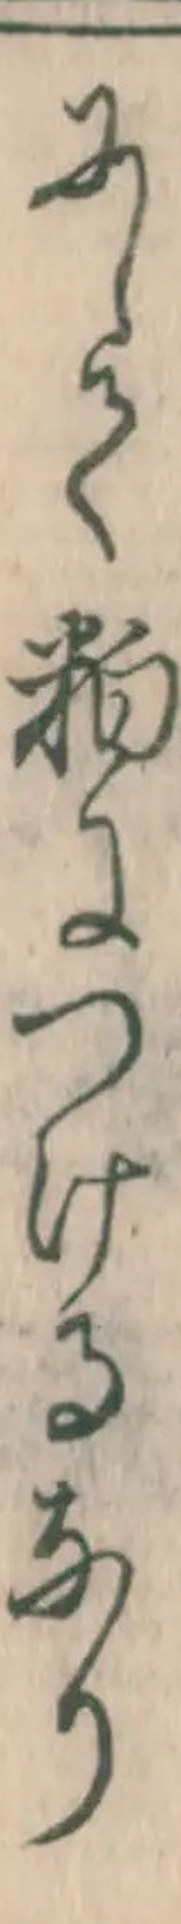にて粕につけるなり
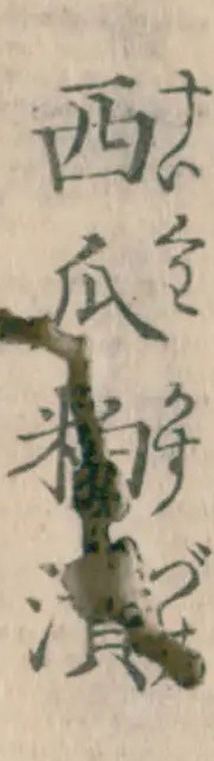西瓜粕漬
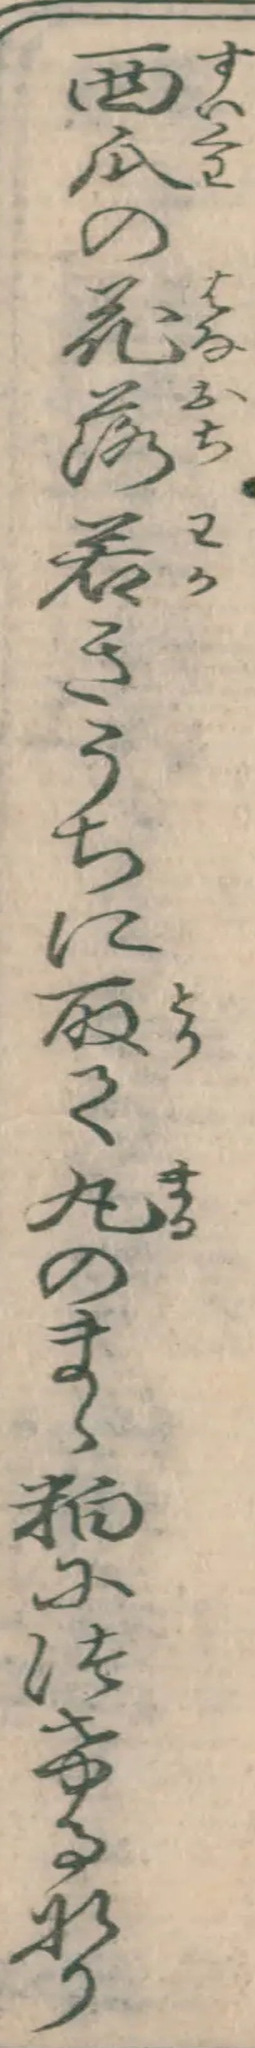西瓜の花落若きうちに取て丸のまゝ粕につけるなり

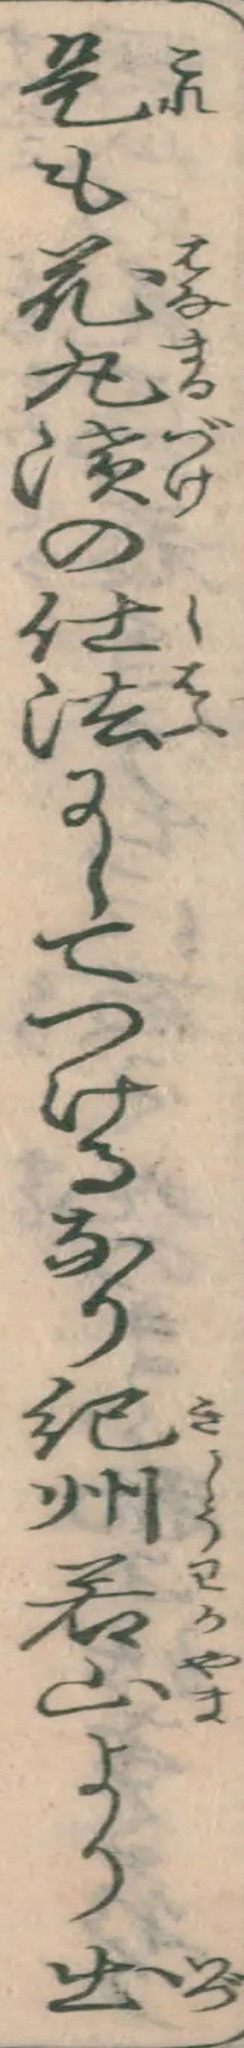是も花丸漬の仕法にしてつけるなり紀州若山より出
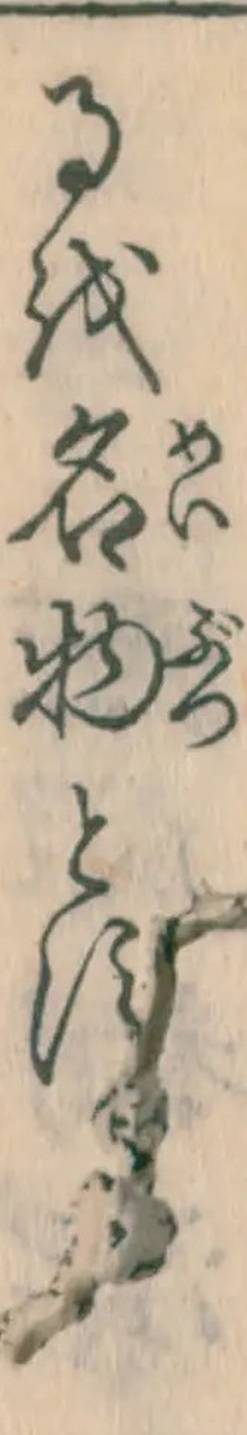るを名物とす
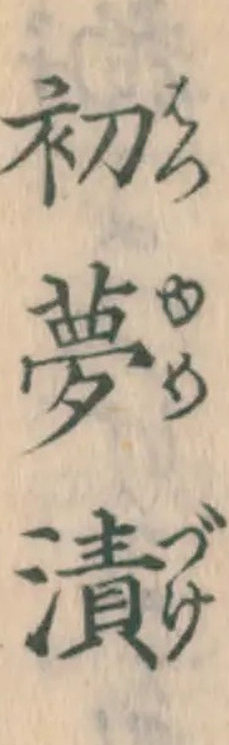初夢漬
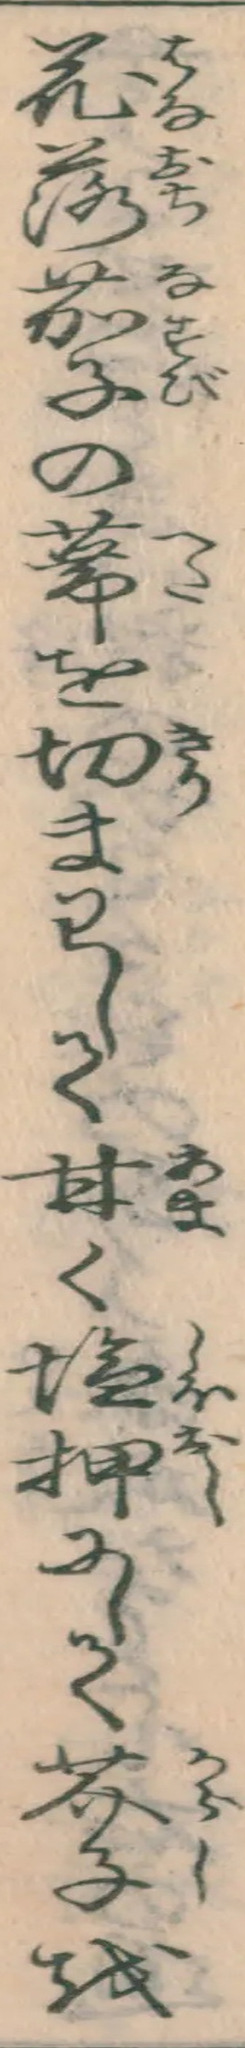花落茄子の蒂を切まわして甘く塩押にして芥子を
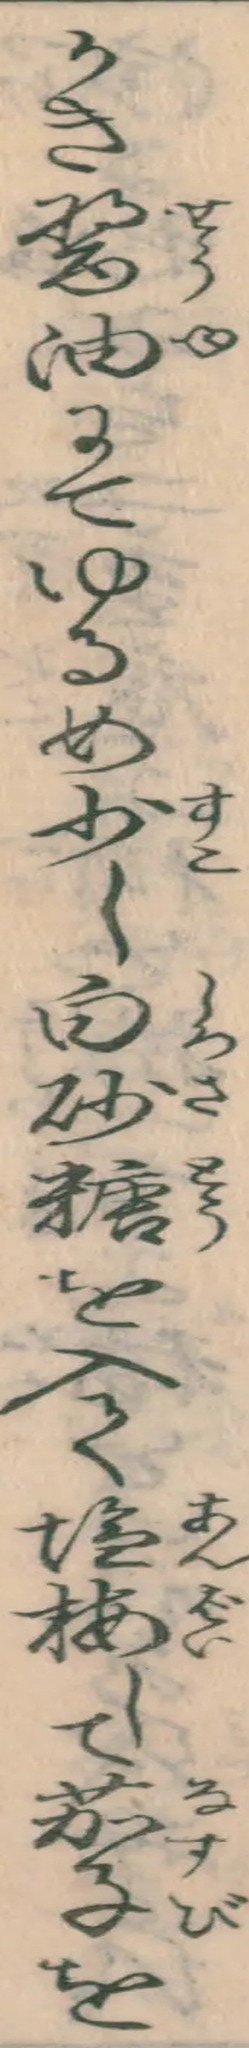かき醤油にてゆるめ少し白砂糖を入て塩梅して茄子を
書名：四季漬物鹽嘉言
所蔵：国立国会図書館 National Diet Library, JAPAN
